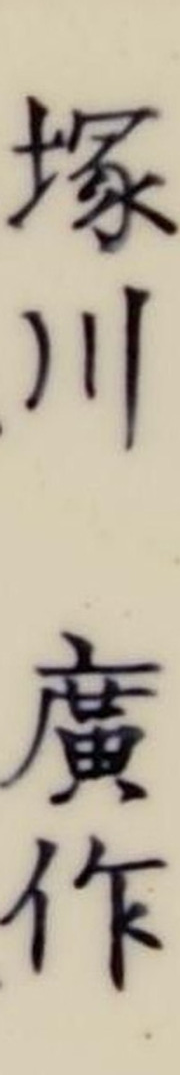塚川広作
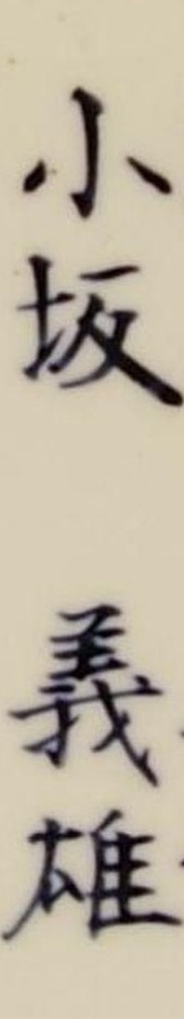小坂義雄
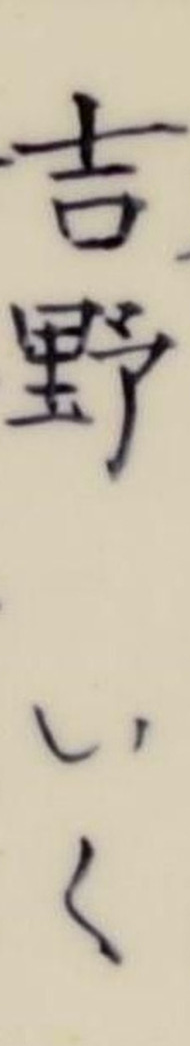吉野いく
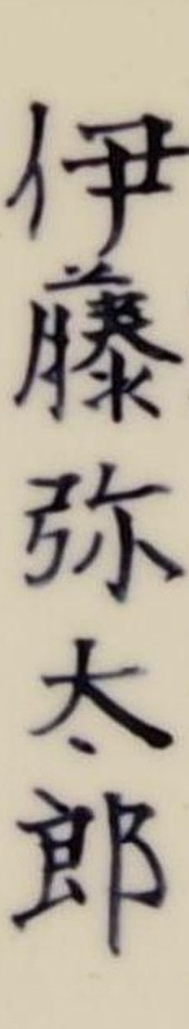伊藤弥太郎
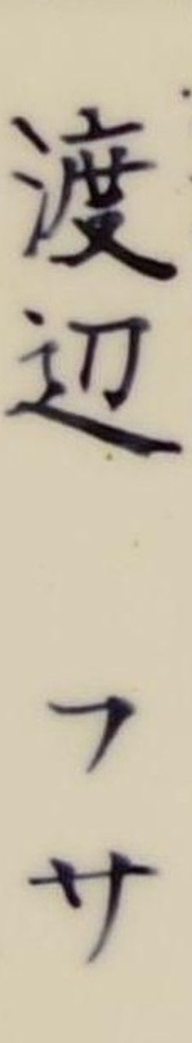渡辺フサ
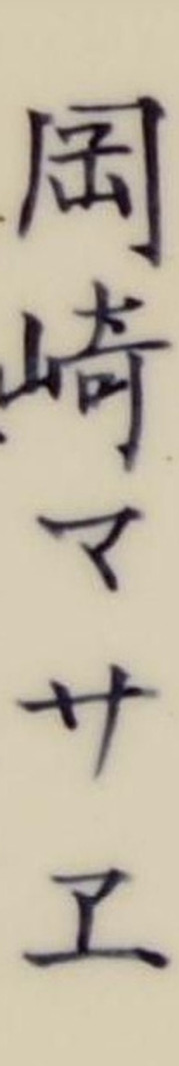岡崎マサヱ
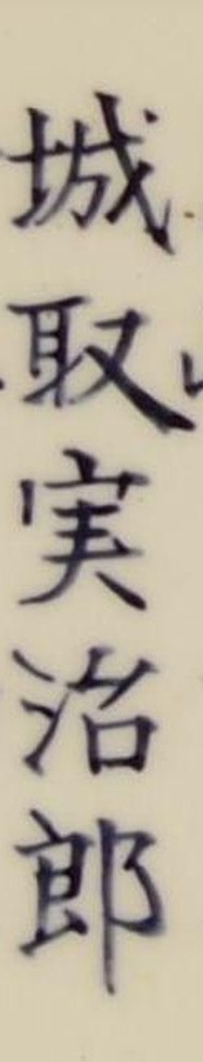城取実治郎
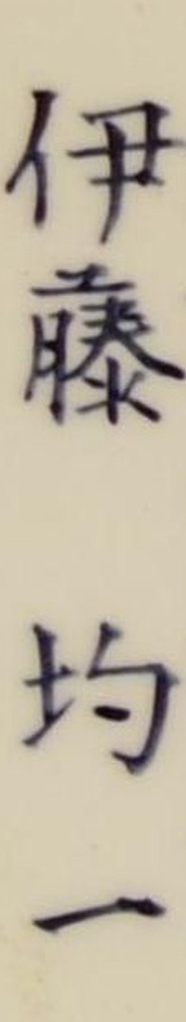伊藤均一
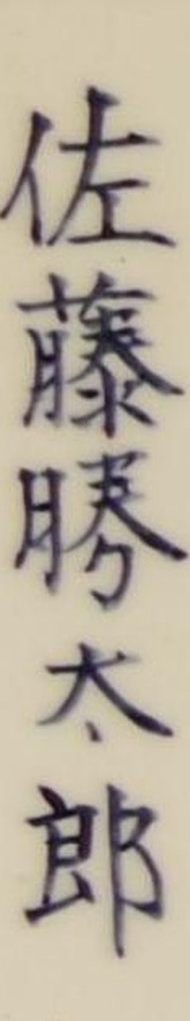佐藤勝太郎
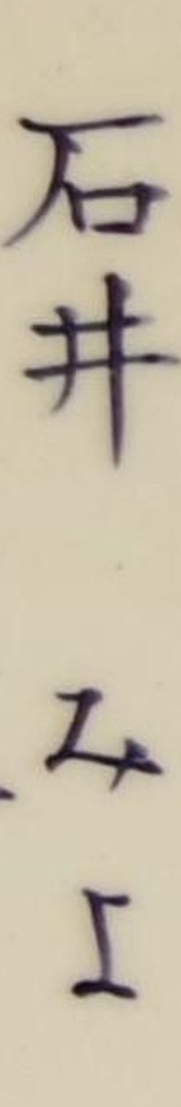石井みよ
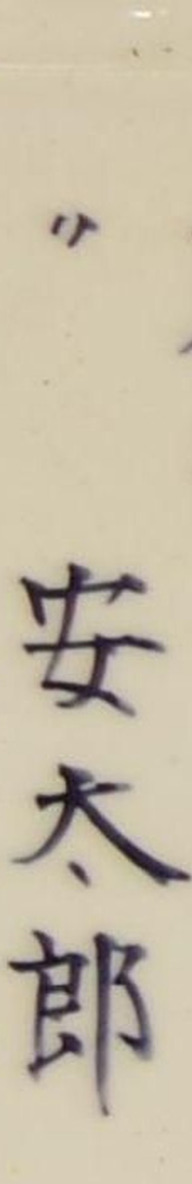安太郎
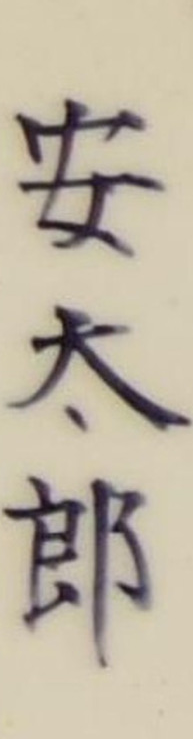安太郎
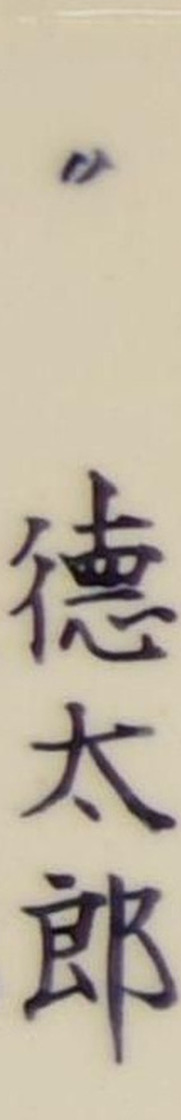徳太郎
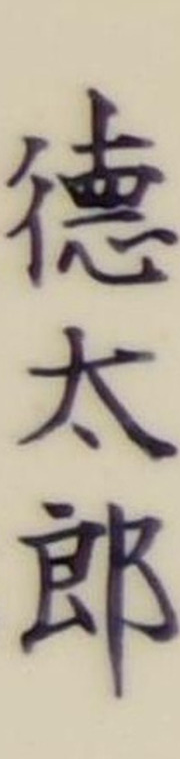徳太郎
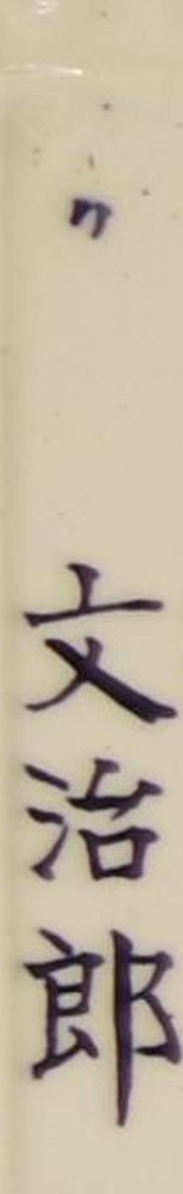文治郎
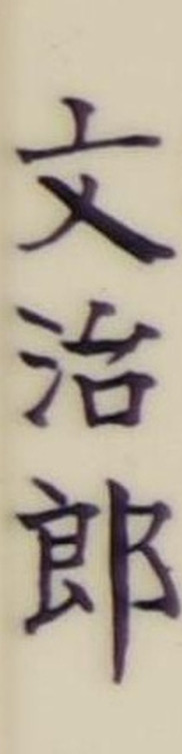文治郎
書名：A~D
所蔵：koyasan kongobuji
